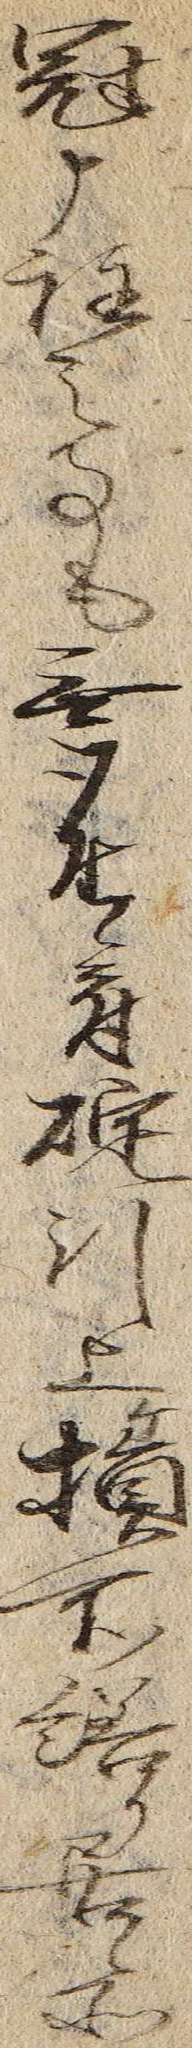冠申程の事も無御座候に付碇引上ケ損所繕り居候所
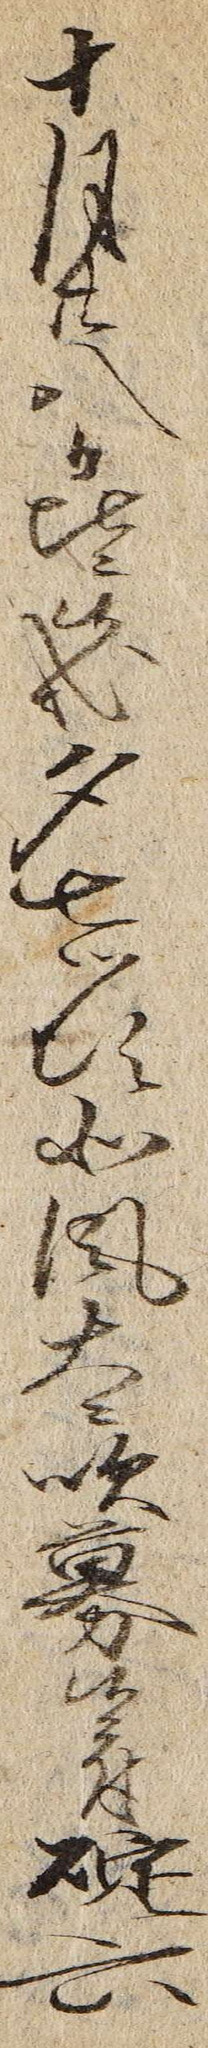十月二十八日頃に候哉夕七ツ頃北風大に吹募候に付碇六
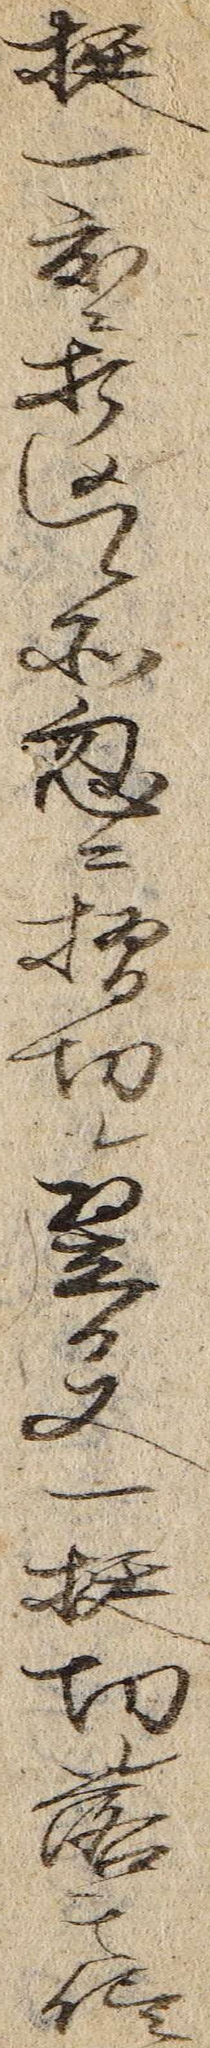挺一度に打込候所忽に摺切レ翌日又一挺切レ落其侭
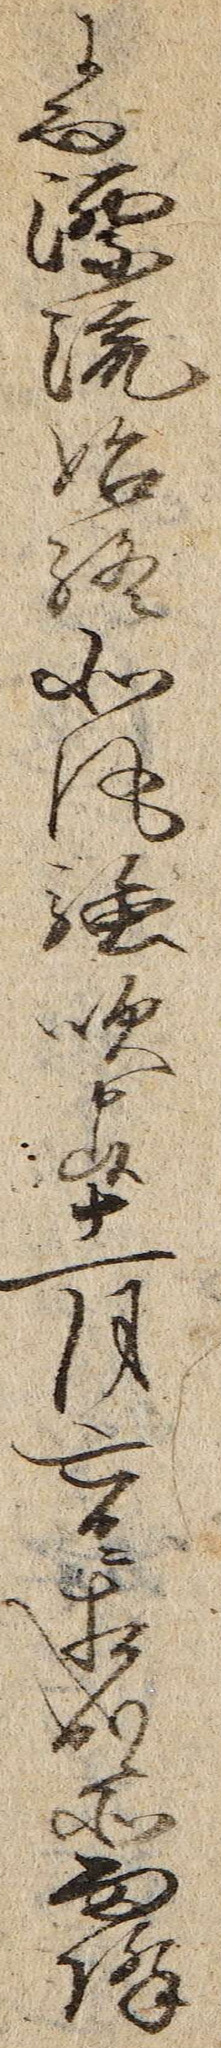にて漂流始終北風強吹申候十一月六日に相成候所雨降
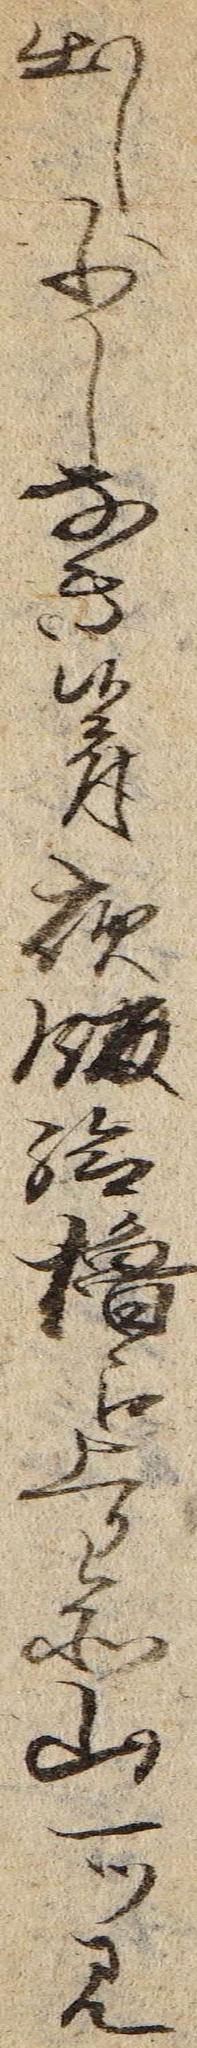出し少しなき候に付夜飯給櫓え上り候所山一つ見
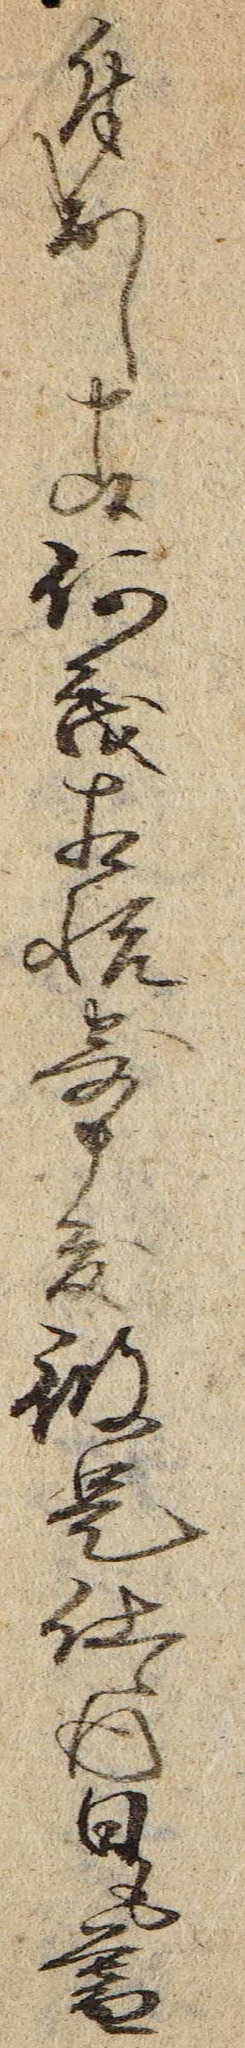付出し申候何も相悦寄申度彼是仕候内日も暮

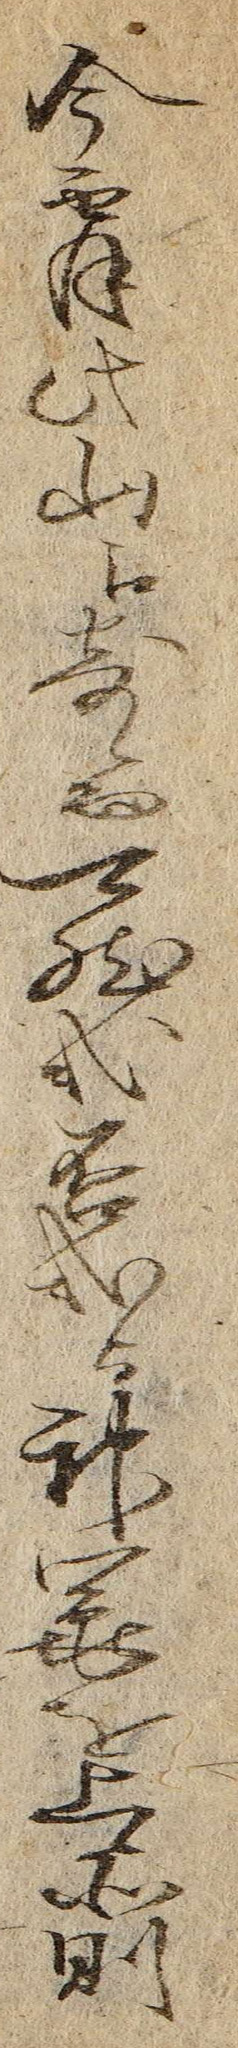今宵此山え寄候て可然哉否哉と神鬮を上候所則
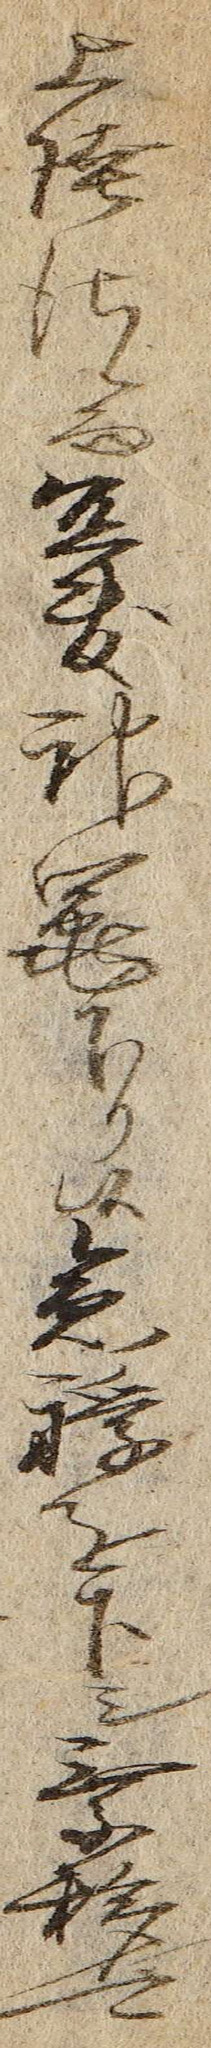上陸仕候て宜しき神鬮下り候急艀を下シ乗移可
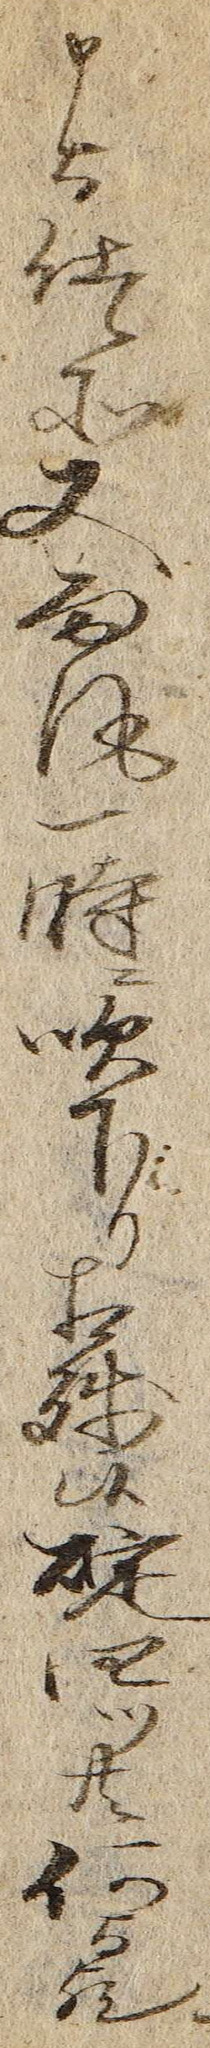申と仕候所又雨風一時に吹下り相残候碇四つとも何と歟
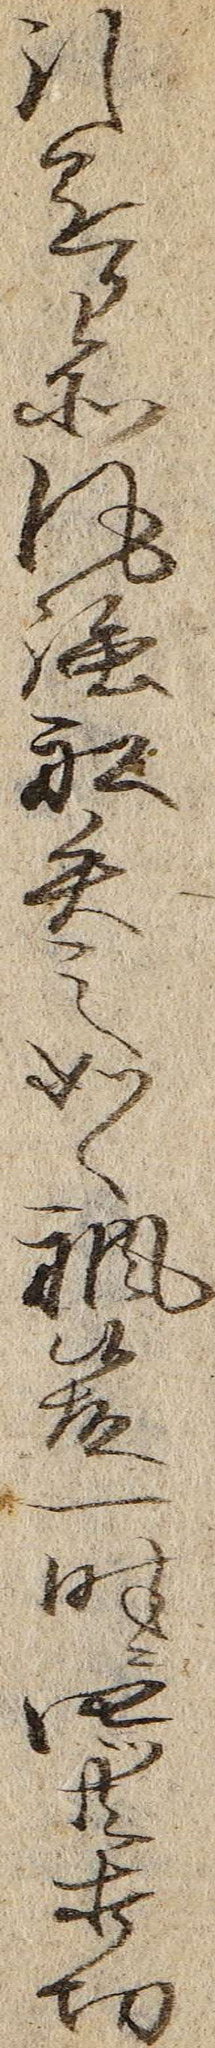引懸り候所風強船矢の如く䑺候故一時に四つとも打切
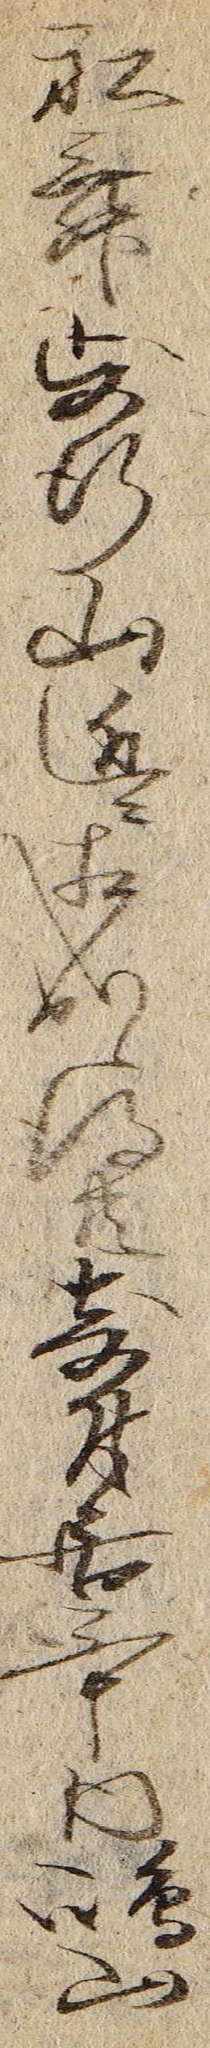船舞歩行山近に相成候得ども寄付居不申内島山
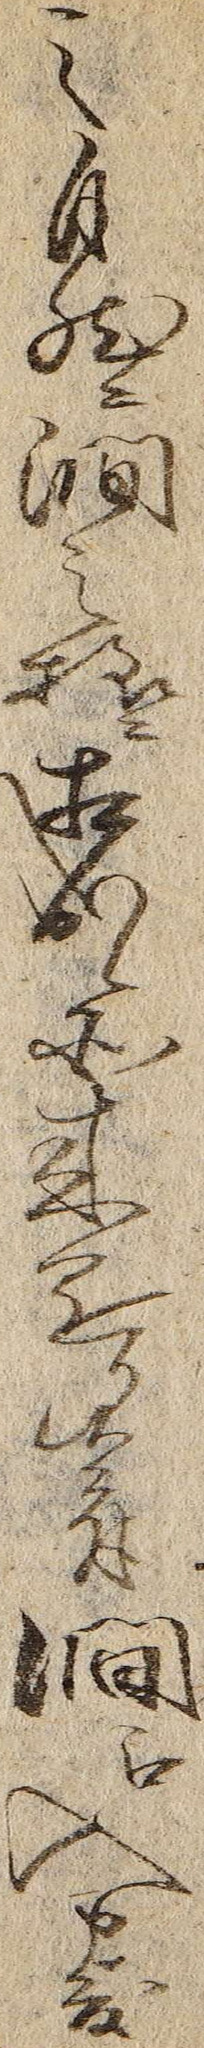の自然に澗の様に相成候所来懸り候に付澗え入申度
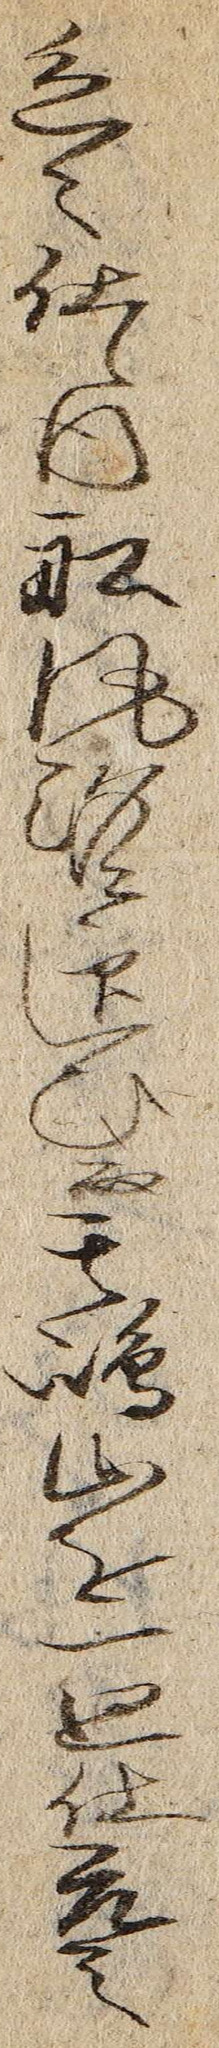色々仕候内船風汐に迎ひて其島山を一廻仕元の
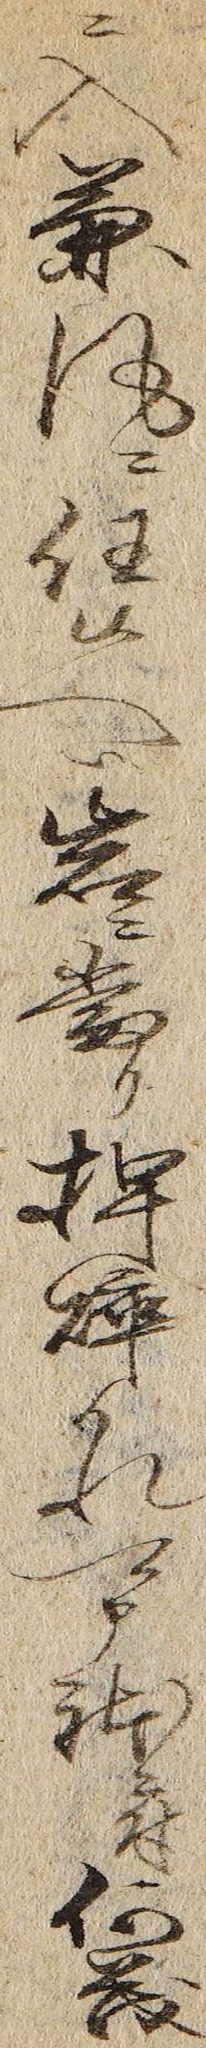に入兼風に任候へは岩に当り押砕かれ可申体に付何も
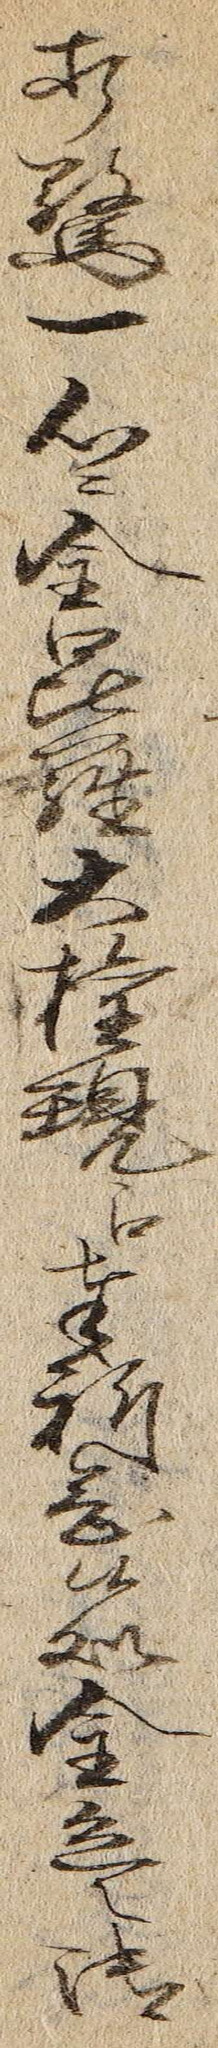打驚一心に金毘羅大権現へ奉祈念候所金色の御
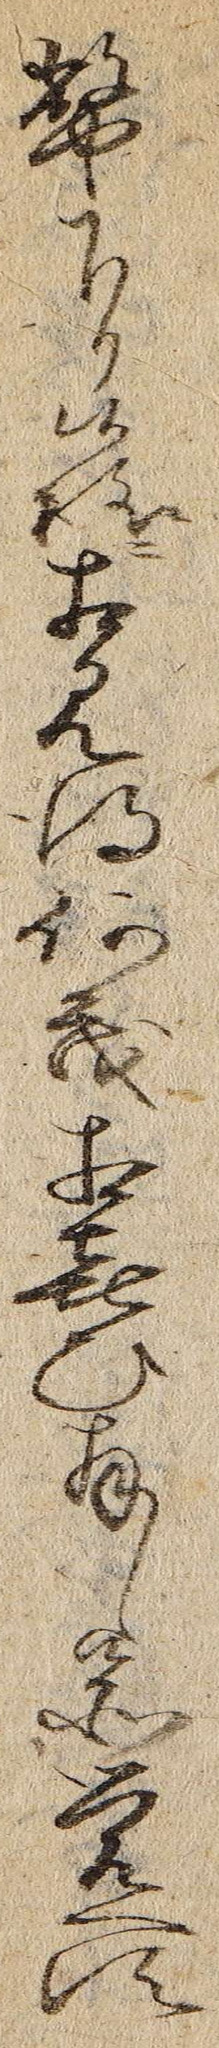幣下り候様に相見え何も相喜ひ拝し候所覚へす
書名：能登国清兵衛異国江漂流之始末
